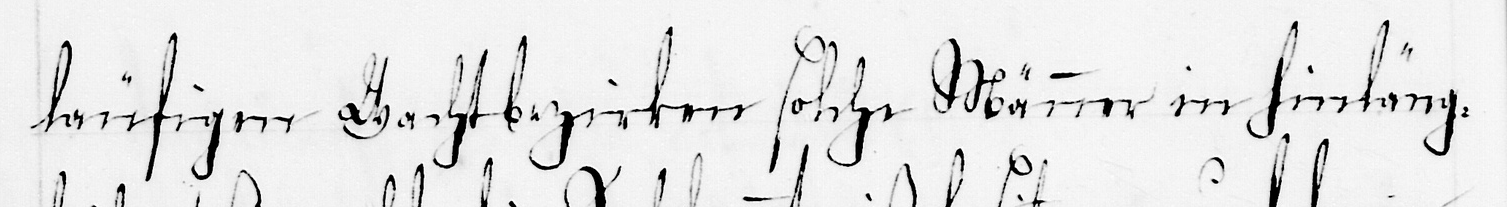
läufigen Wachtbezirken solche Männer in hinläng¬
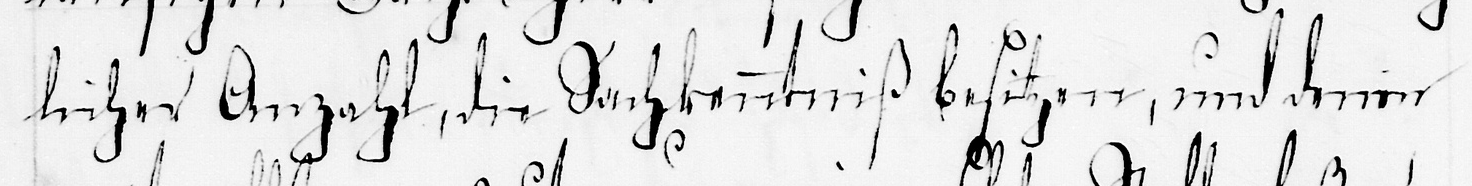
licher Anzahl, die Sachkenntniß besitzen, und denen
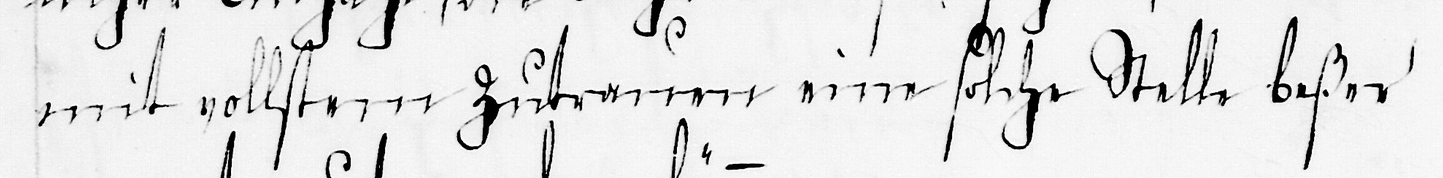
mit vollstem Zutrauen eine solche Stelle beßer
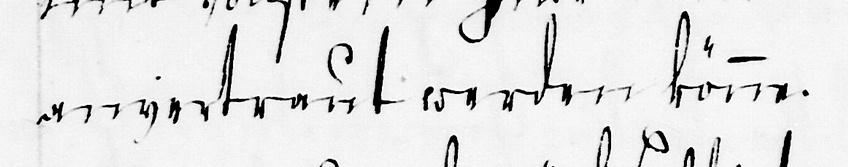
anvertraut werden könne.
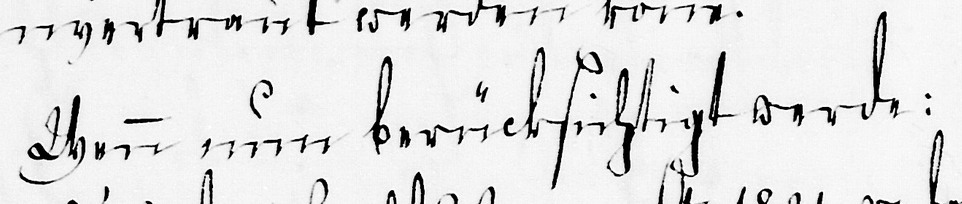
Wenn nun berücksichtigt werde:
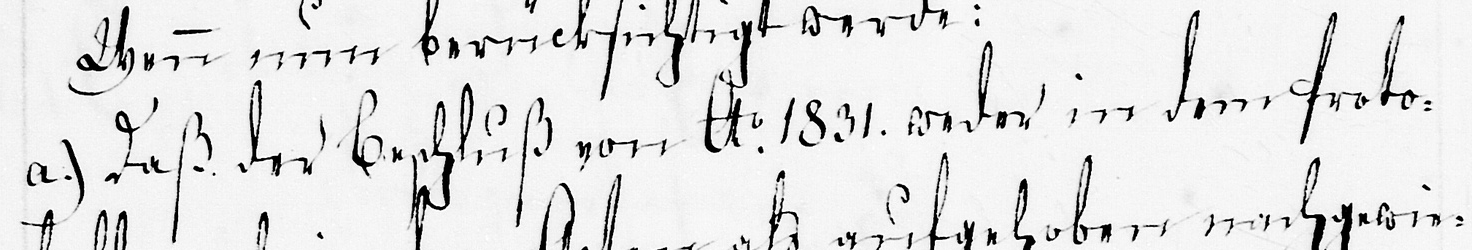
a.) Daß der Beschluß von Ao. 1831. weder in dem Proto¬
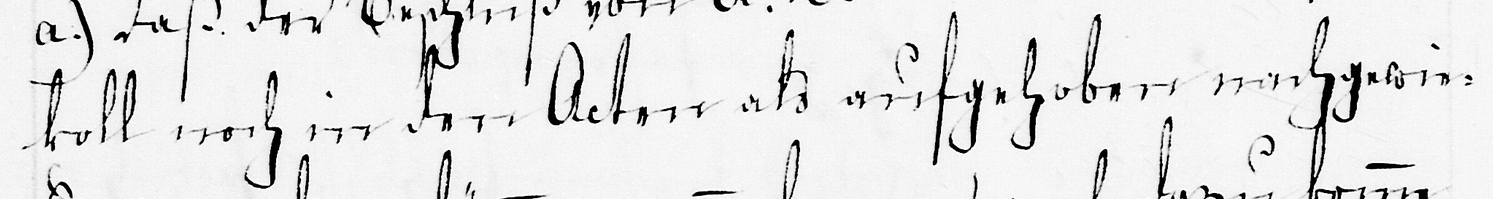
koll noch in den Acten als aufgehoben nachgewie¬
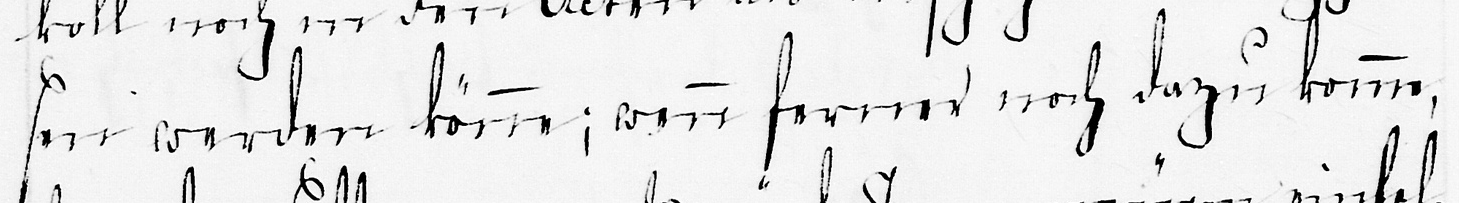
sen werden könne; wenn ferner noch dazu komme,
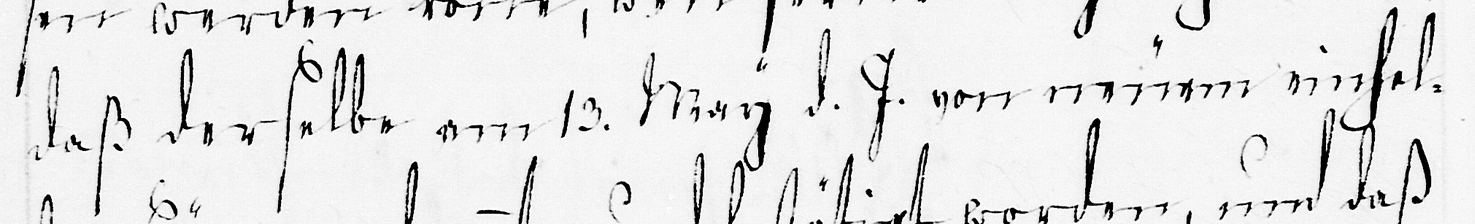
daß derselbe am 13. May d. J. von neuem einhel¬
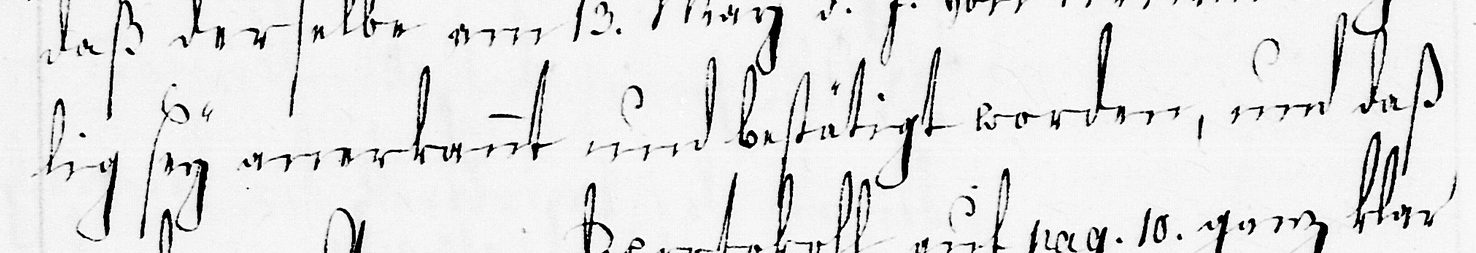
lig sey anerkannt und bestätigt worden, und daß
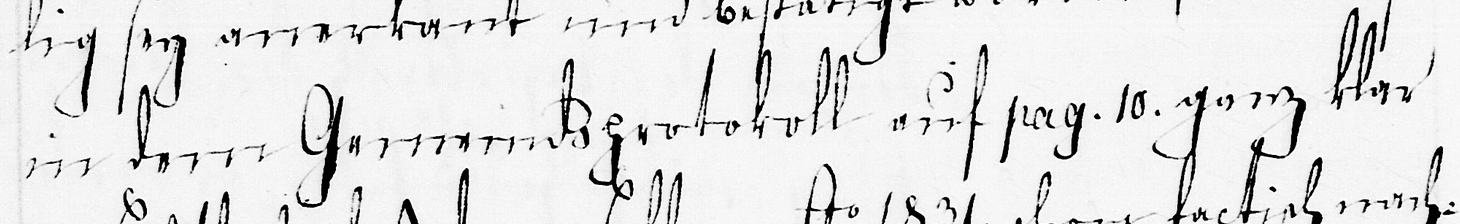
in dem Gemeindsprotokoll auf pag. 10. ganz klar
